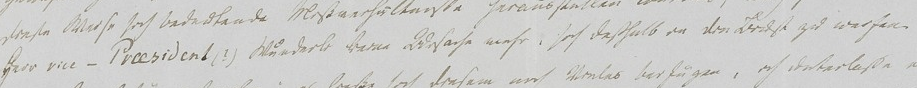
Herr vice-Praesicent (?) Wunderli keine Ursache mehr, sich deßhalb in die Brust zu werfen.
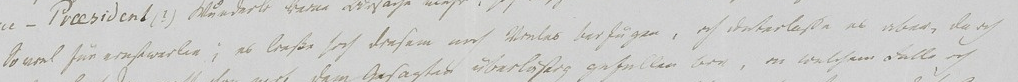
So viel für einstweilen; es ließe sich diesem noch Vieles beifügen, ich unterlasse es aber, da ich
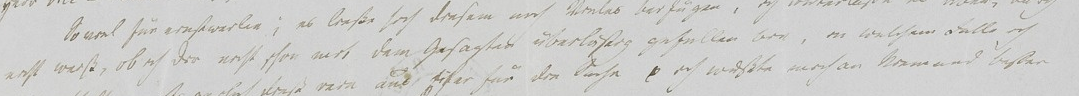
nicht weiß, ob ich Dir nicht schon mit dem Gesagten überlästig gefallen bin, in welchem Falle ich
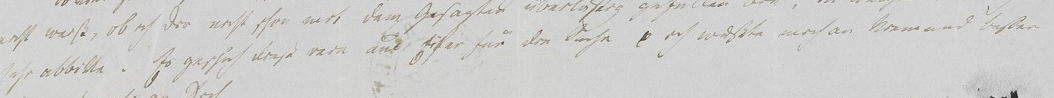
sehr abbitte. Es geschah dieß rein aus Eifer für die Sache & ich wusste mich an Niemand beßer
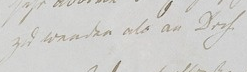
zu wenden als an Dich.
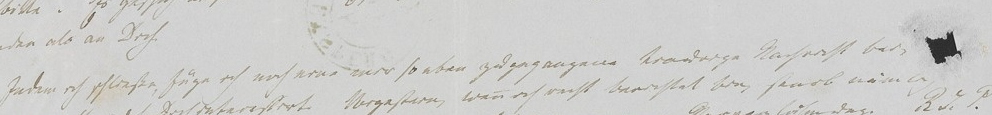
Indem ich schließe, füge ich noch eine mir so eben zugegangene traurige Nachricht bei, die
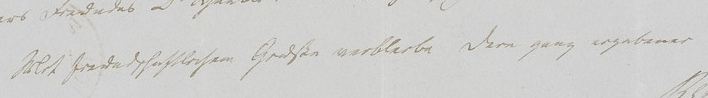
Mit freundschaftlichem Gruße verbleibe Dein ganz ergebener
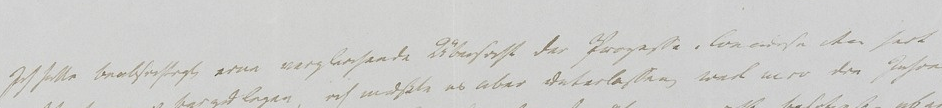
Ich hatte beabsichtigt, eine vergleichende Übersicht der Prozesse, Concurse cta seit
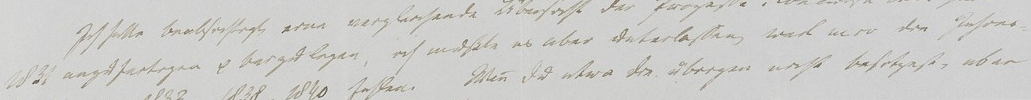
1831 anzufertigen & beizulegen, ich mußte es aber unterlassen, weil mir die Jahres-
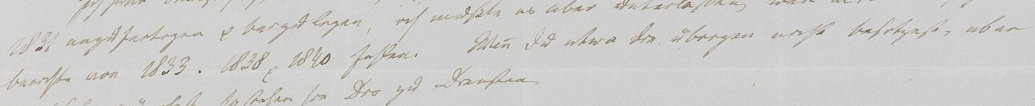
berichte von 1833, 1838 und 1840 fehlen. Wenn Du etwa die übrigen nicht besitzest, aber
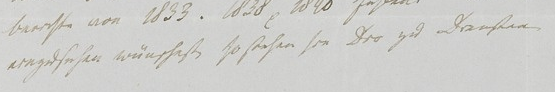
einzusehen wünschest, so stehen sie Dir zu Diensten.
